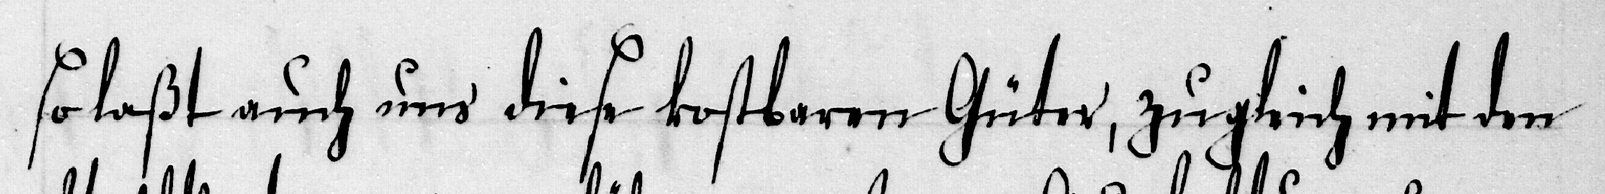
so laßt auch uns diese kostbaren Güter, zugleich mit den
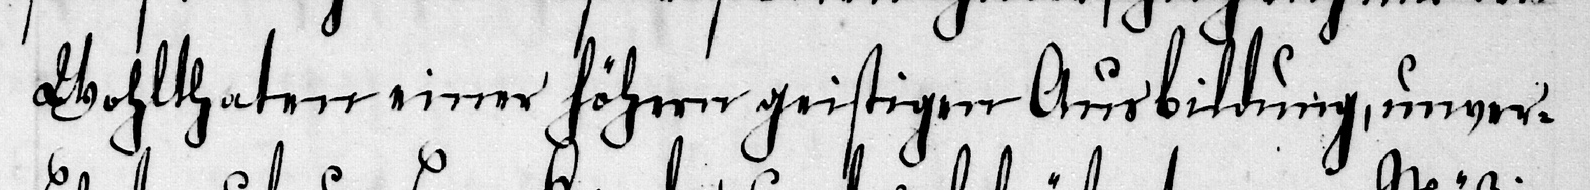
Wohlthaten einer höhern geistigen Ausbildung, unver¬
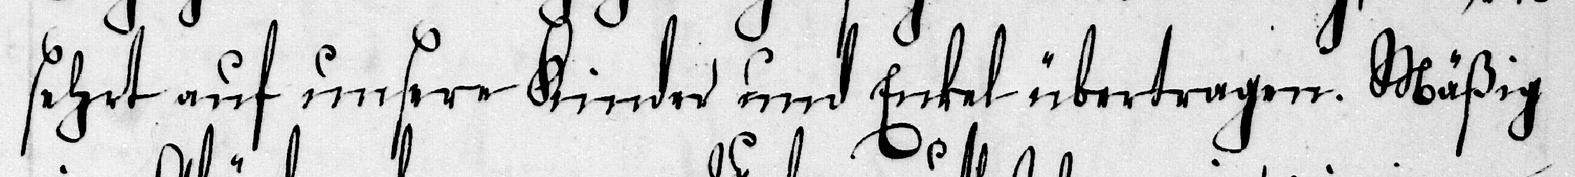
sehrt auf unsere Kinder und Enkel übertragen. Mäßig
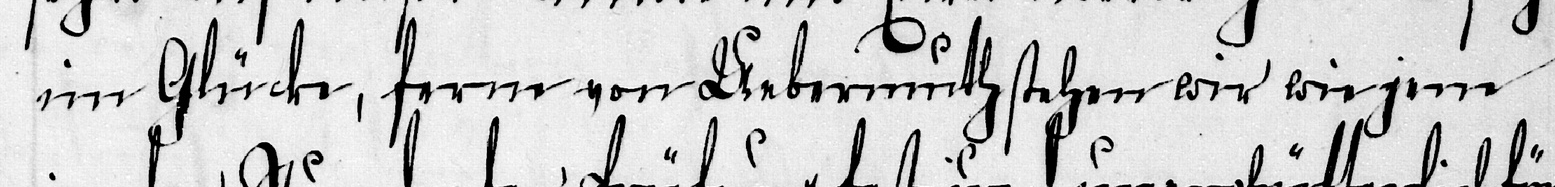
im Glücke, ferne von Uebermuth stehen wir wie jene
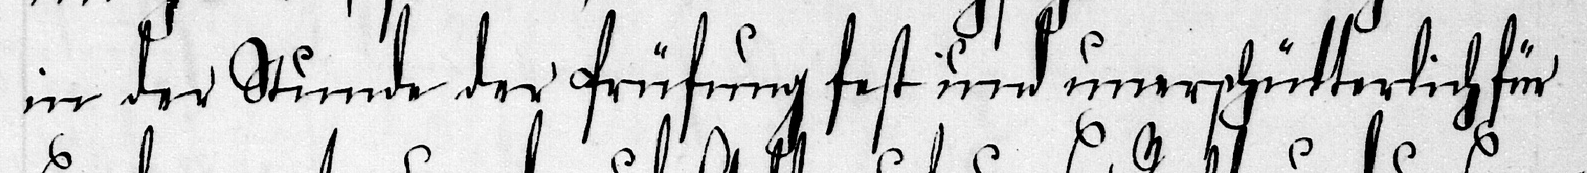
in der Stunde der Prüfung fest und unerschütterlich für
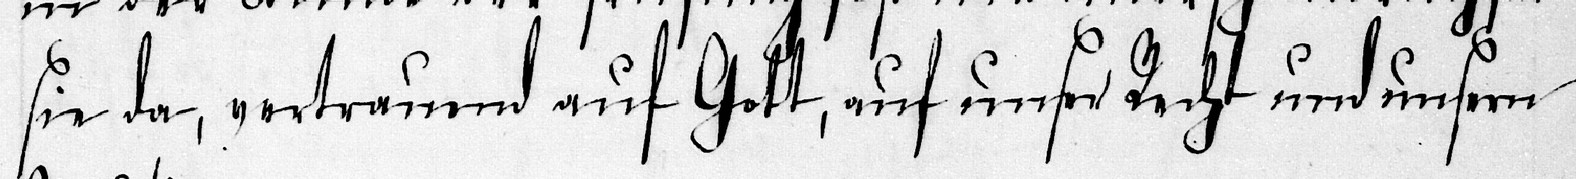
sie da, vertrauend auf Gott, auf unser Recht und unsern
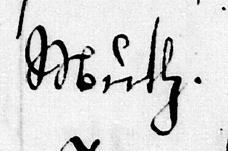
Muth.
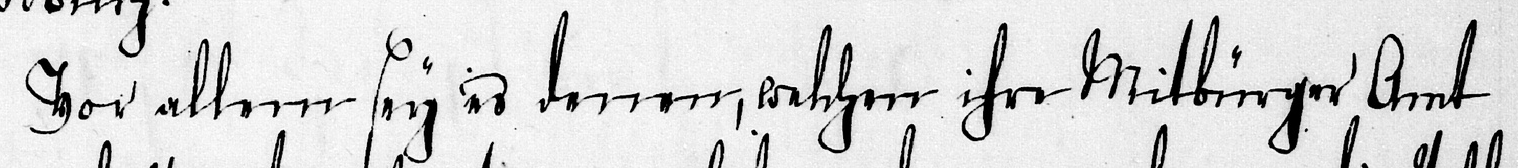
Vor allem sey es denen, welchen ihre Mitbürger Amt
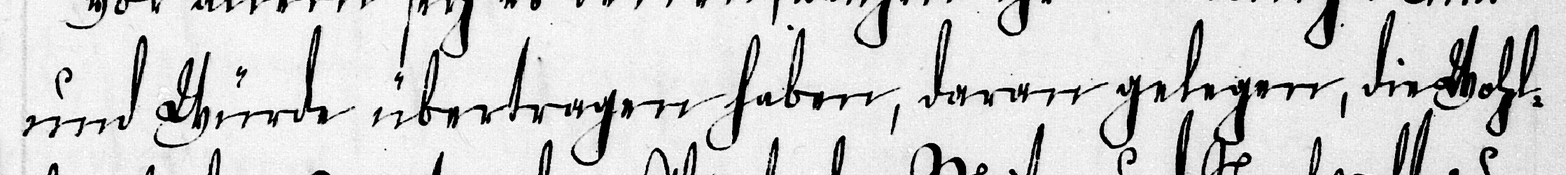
und Würde übertragen haben, daran gelegen, die Wohl¬
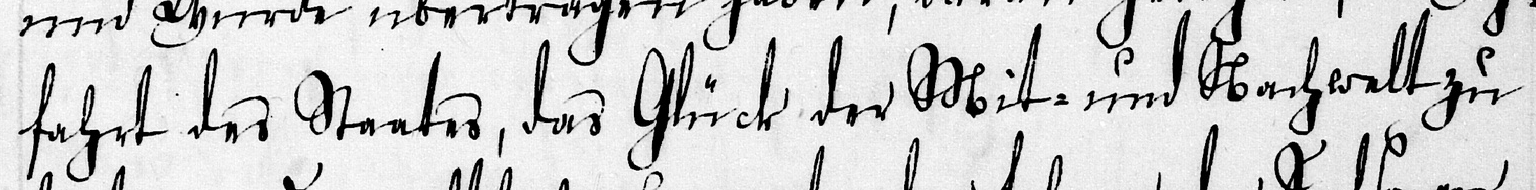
fahrt des Staates, das Glück der Mit-und Nachwelt zu
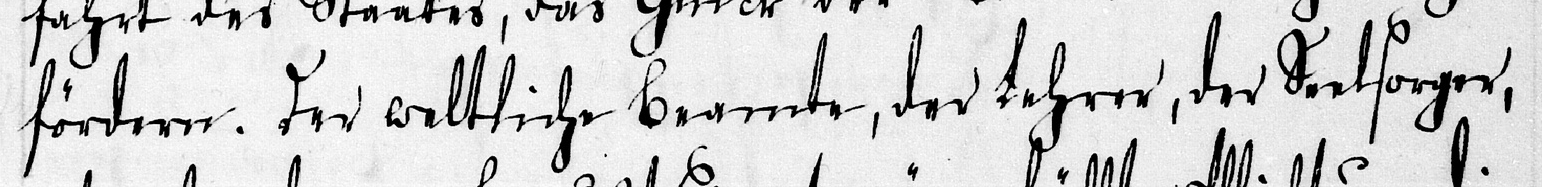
fördern. Der weltliche Beamte, der Lehrer, der Seelsorger,
